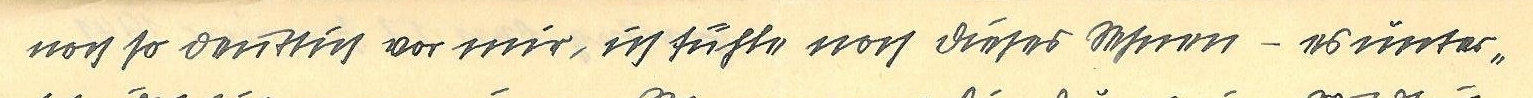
noch so deutlich vor mir, ich fühle noch dieses Sehnen – es unter¬
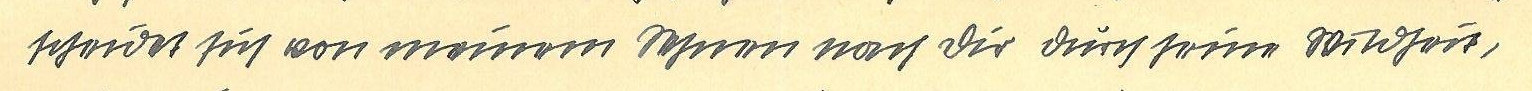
scheidet sich von meinem Sehnen nach Dir durch seine Wildheit,
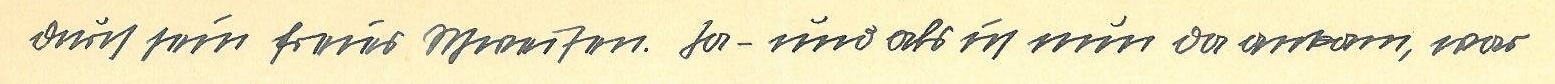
durch sein freies Schweifen. Ja – und als ich nun da ankam, war
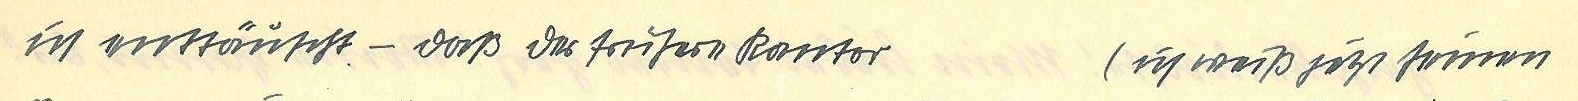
ich enttäuscht – daß der frühere Kantor (ich weiß jetzt seinen
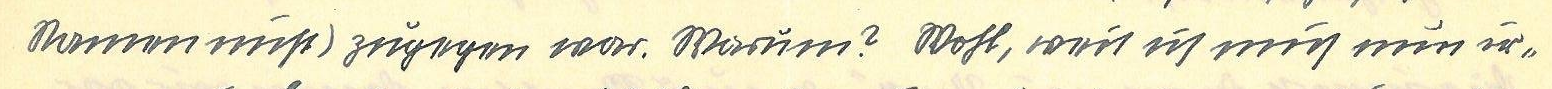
Namen nicht) zugegen war. Warum? Wohl, weil ich mich nun ir¬
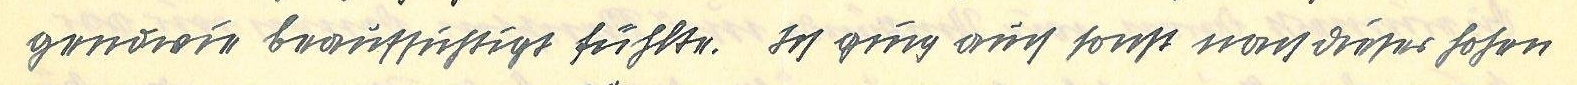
gendwie beaufsichtigt fühlte. Ich ging auch sonst nach dieser hohen
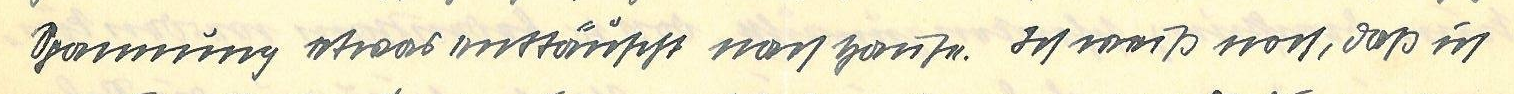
Spannung etwas enttäuscht nach Hause. Ich weiß noch, daß ich
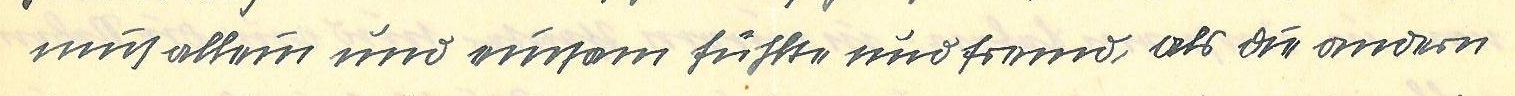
mich allein und einsam fühlte und fremd, als die anderen
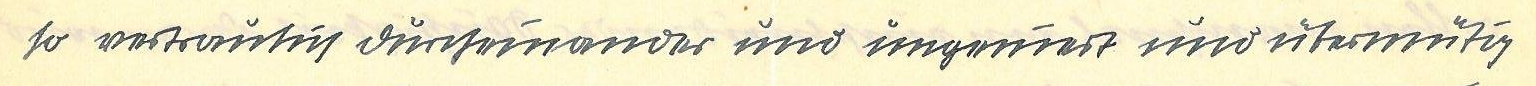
so vertraulich durcheinander und ungeniert und übermütig
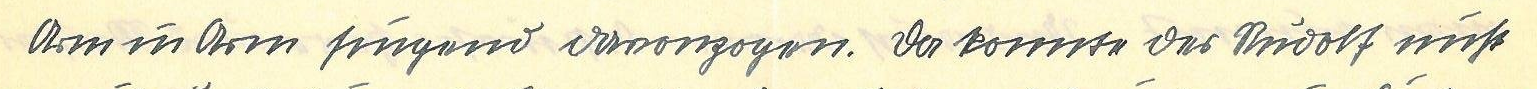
Arm in Arm singend davongezogen. Da konnte der nicht
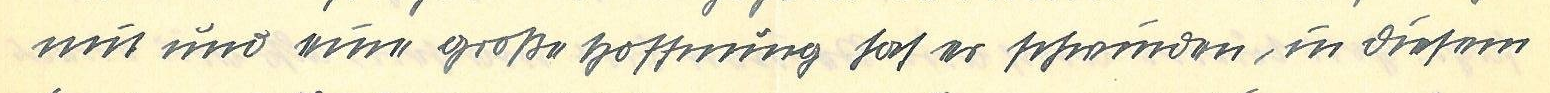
mit und eine große Hoffnung sah er schwinden, in diesem
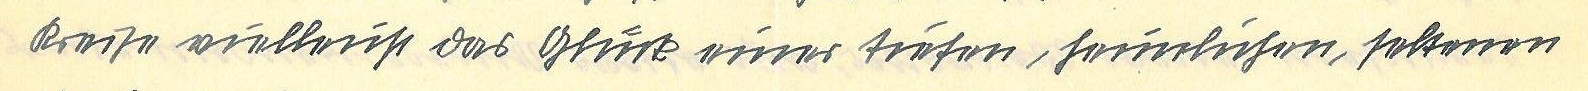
Kreise vielleicht das Glück einer tiefen, heimlichen, seltenen
